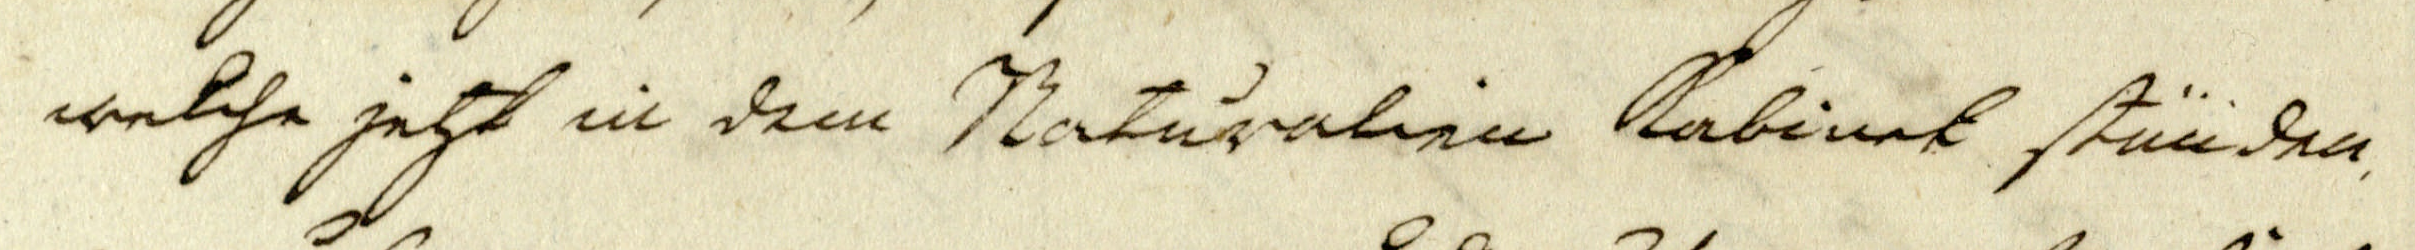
welche jetzt in dem Naturalien Kabinet stünden,
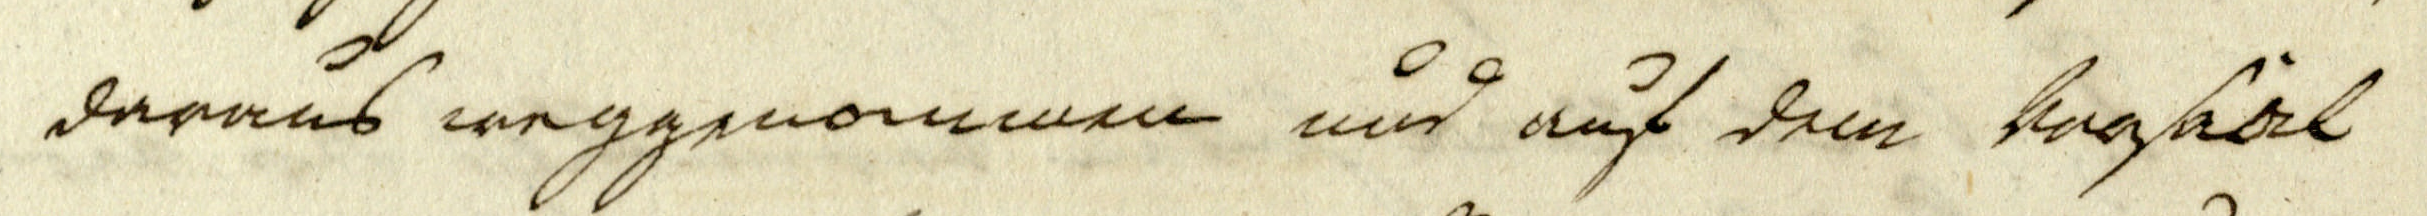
daraus weggenommen und auf dem Vorsaal
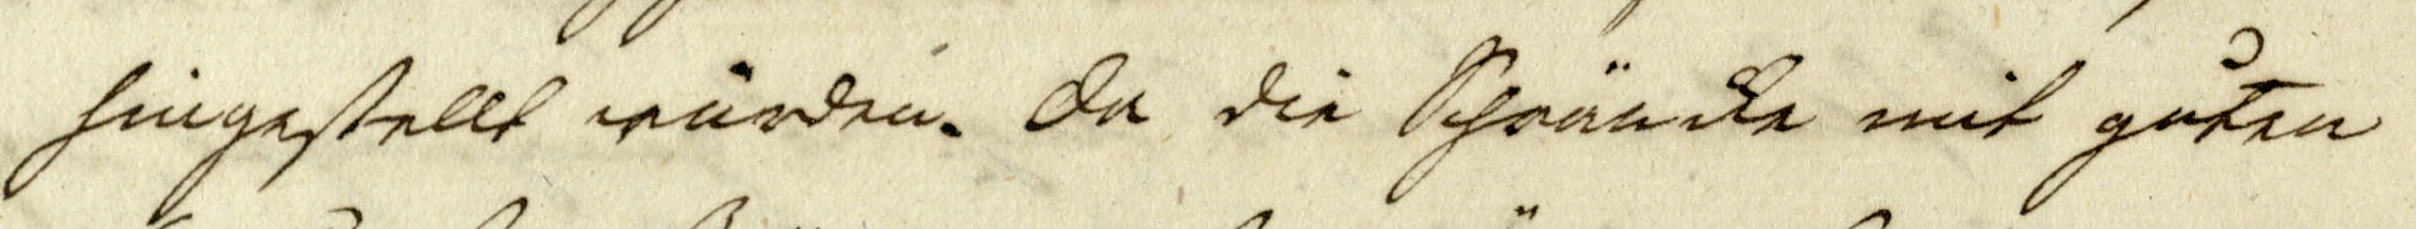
hingestellt würden. Da die Schräncke mit guten
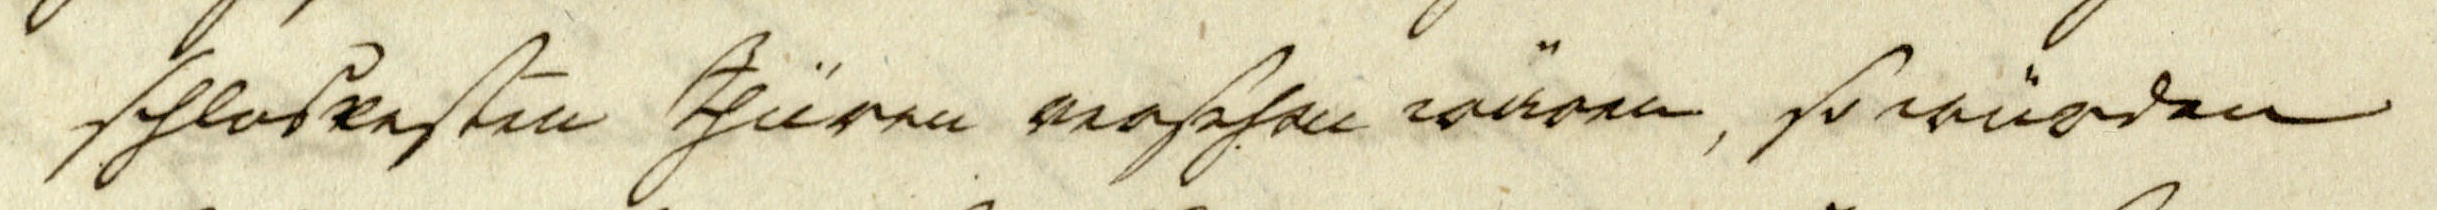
schlosvesten Thüren versehen wären, so würden
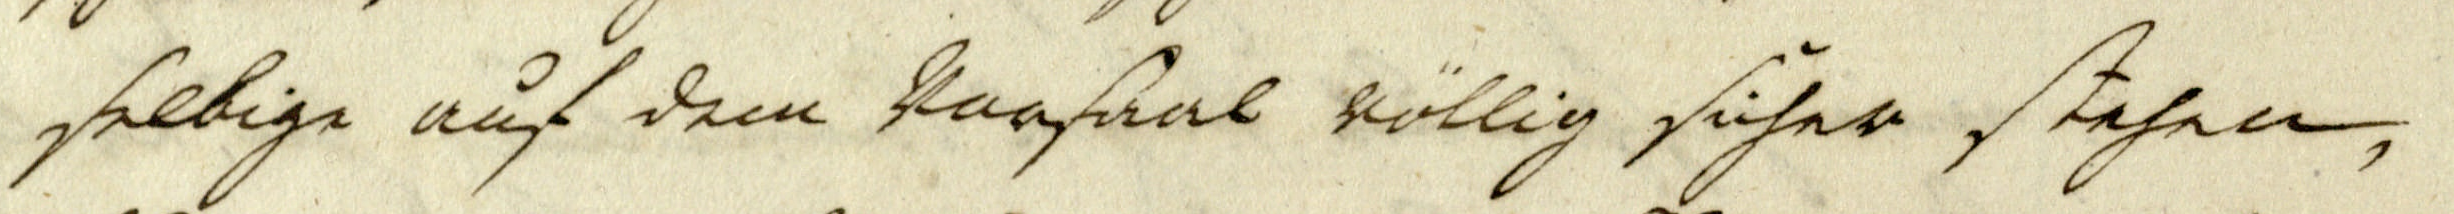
selbige auf dem Vorsaal völlig sicher stehen,
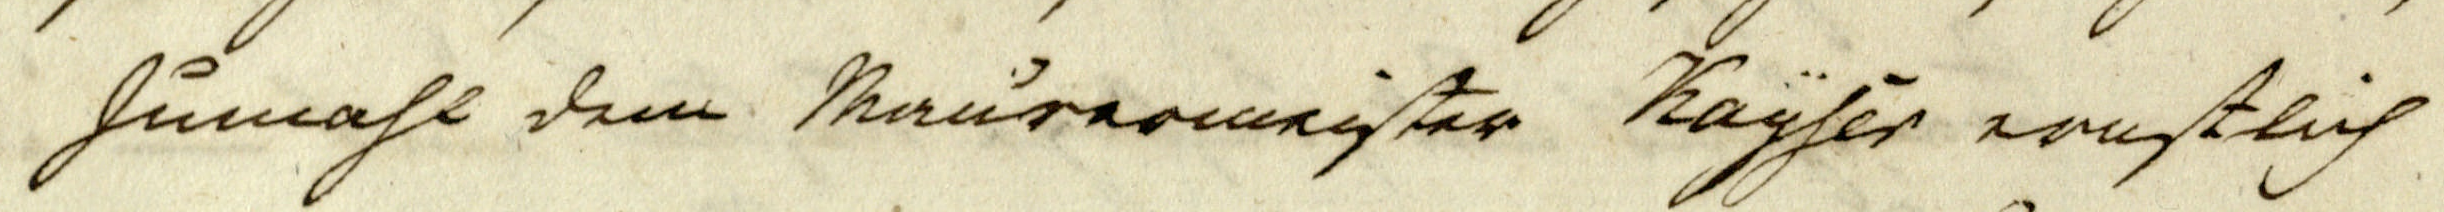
zumahl dem Maurermeister Kaÿser ernstlich
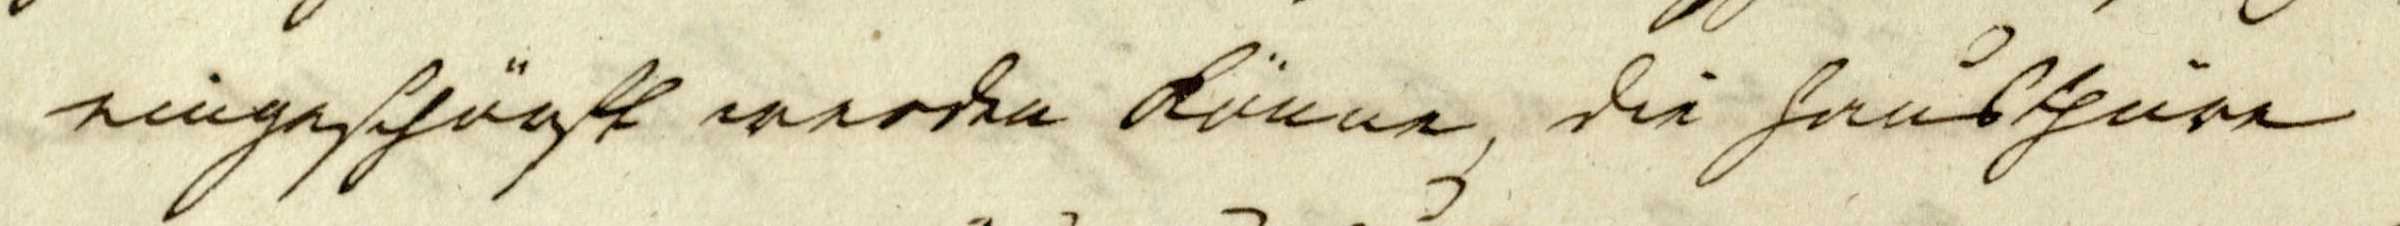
eingeschärft werden könne, die Hausthüre
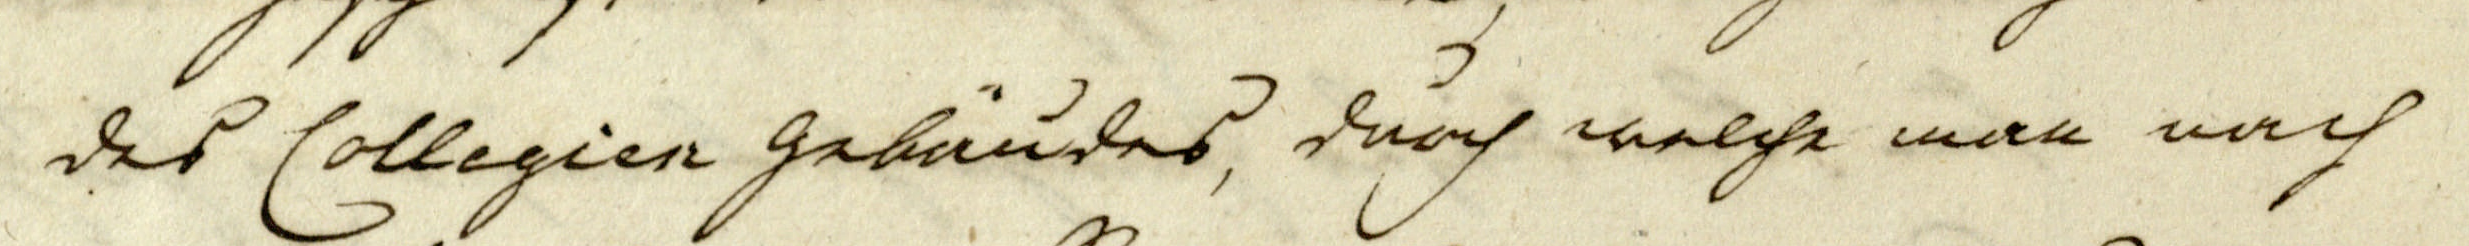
des Collegien Gebäudes, durch welche man nach
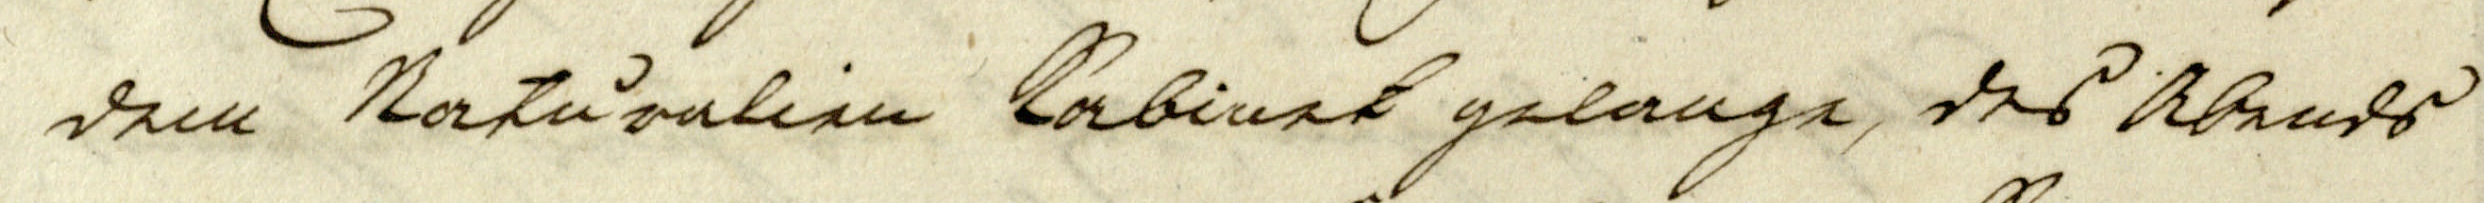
dem Naturalien Kabinet gelange, des Abends
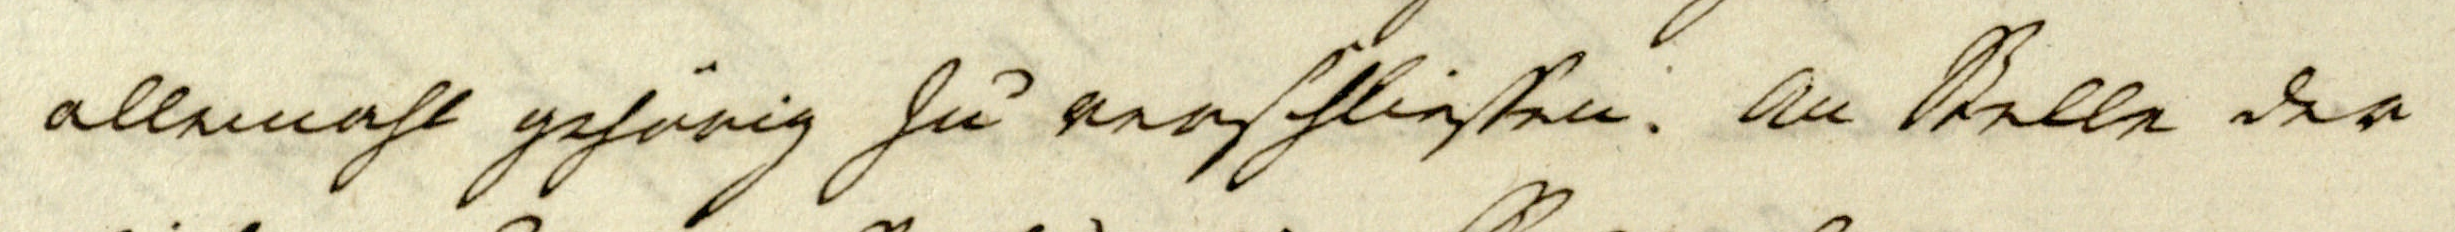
allemahl gehörig zu verschliessen. An Stelle der
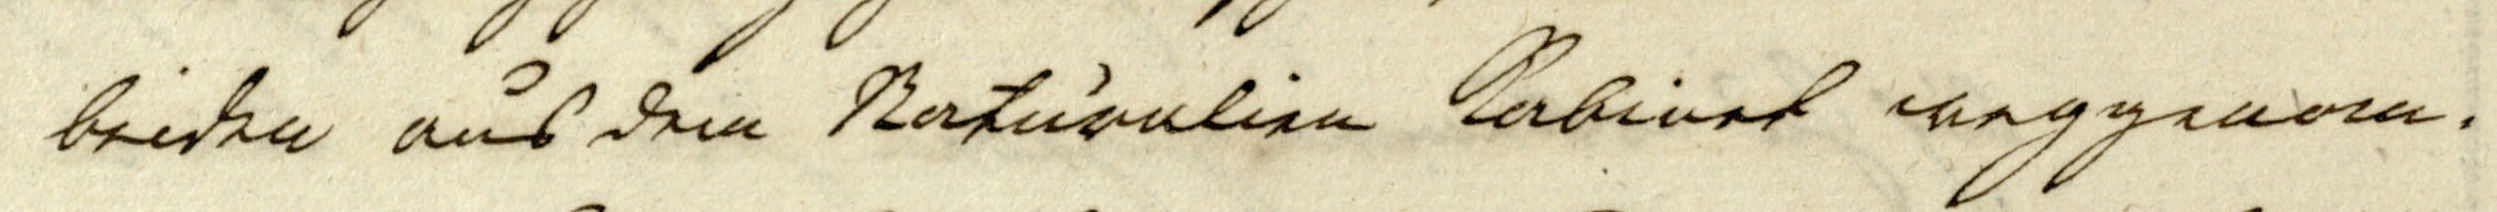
beiden aus dem Naturalien Kabinet weggenom¬
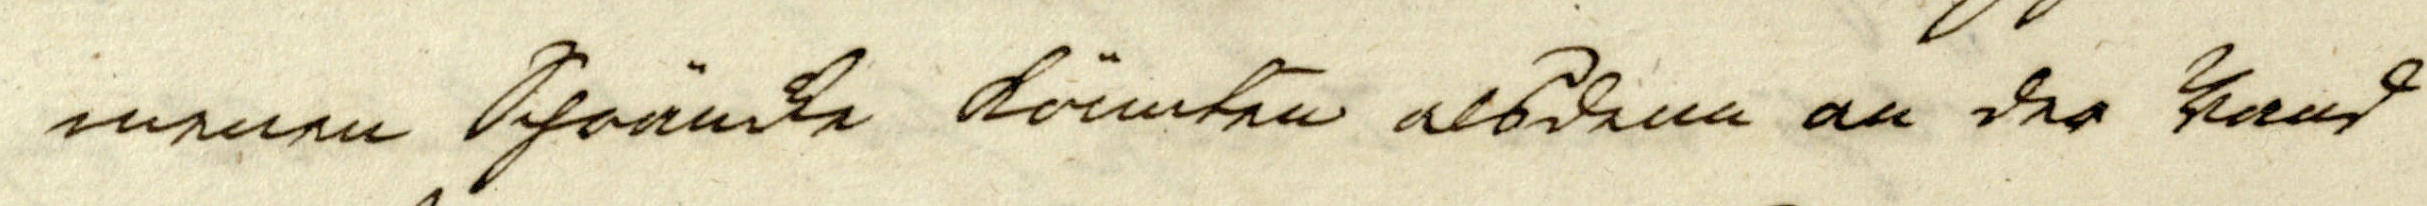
menen Schräncke könnten alsdenn an der Wand
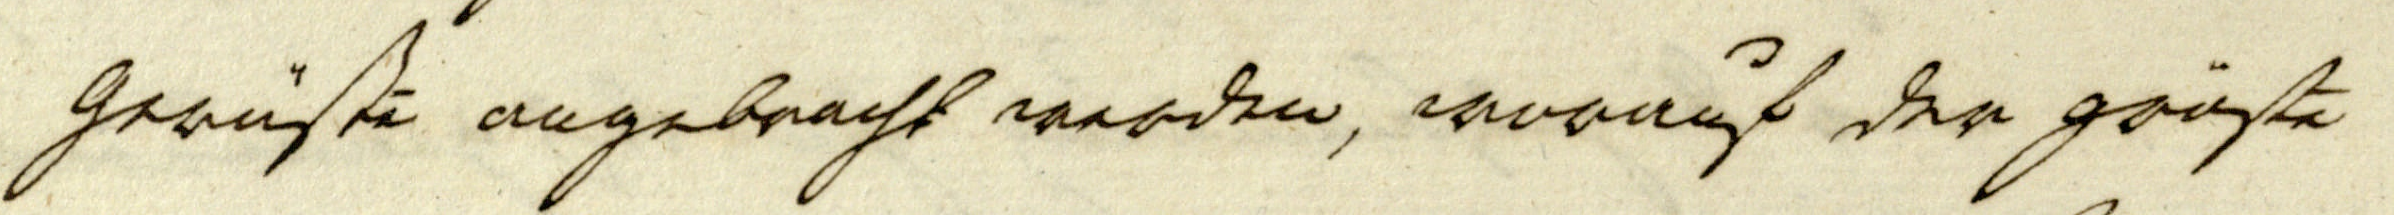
Gerüste angebracht werden, worauf der gröste
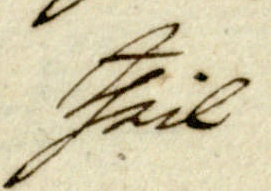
Theil
